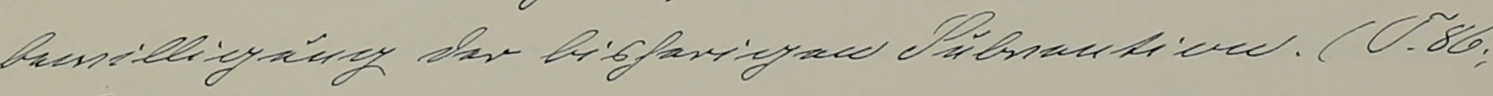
bewilligung der bisherigen Subvention. (T.86;
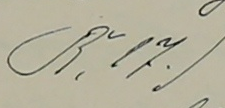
R.17.)
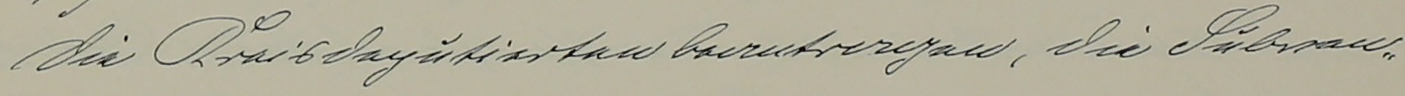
Die Kreisdeputierten beantragen, die Subven-
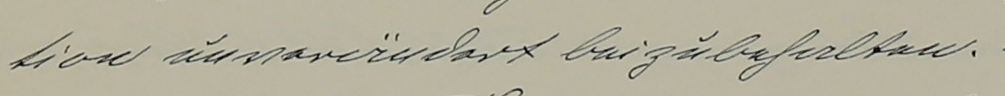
tion unverändert beizubehalten.
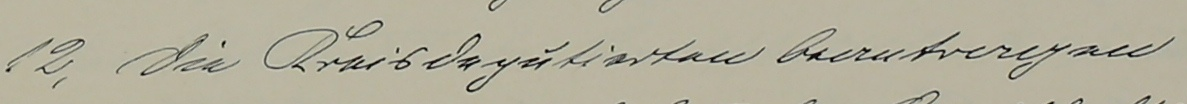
12. Die Kreisdeputierten beantragen
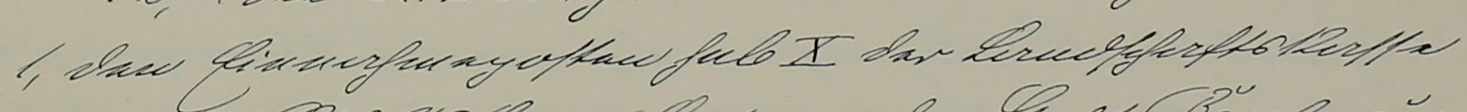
1. Den Einnahmeposten sub X der Landschaftskasse
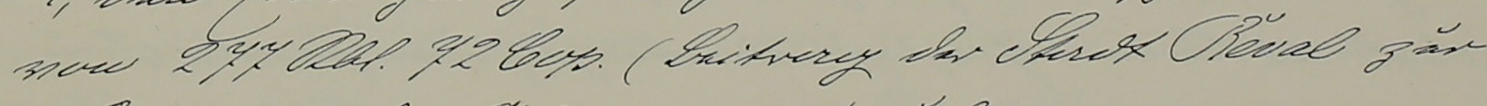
von 277 Rbl. 72 Cop. (Beitrag der Stadt Reval zur
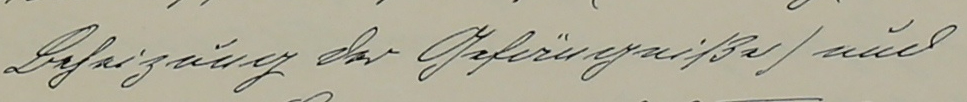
Beheizung der Gefängniße) und
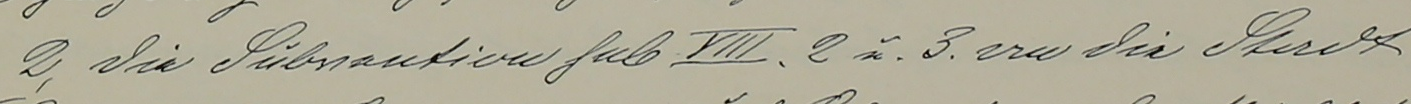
2. die Subvention sub VIII.2 u. 3. an die Stadt
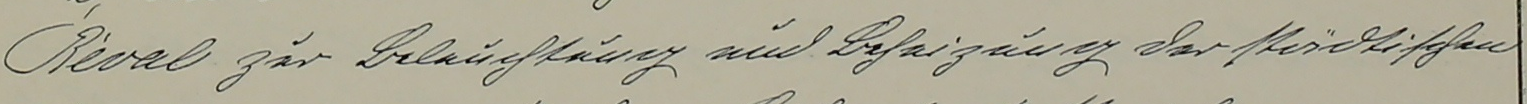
Reval zur Beleuchtung und Beheizung der städtischen
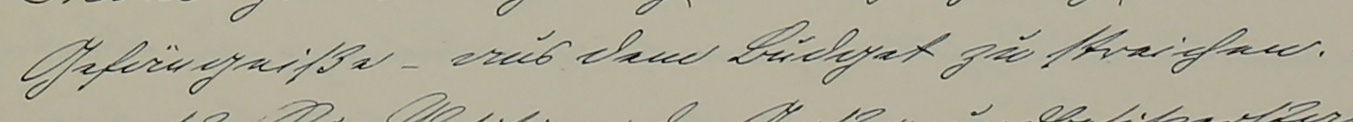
Gefängniße - aus dem Budget zu streichen.
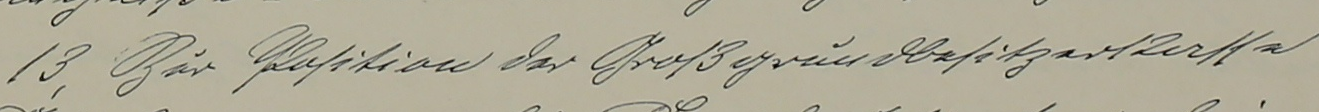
13. Zur Position der Großgrundbesitzerkasse
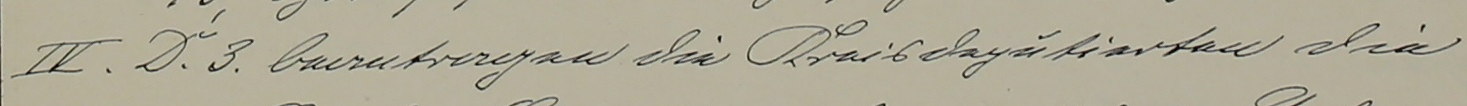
IV. D.3. beantragen die Kreisdeputierten die
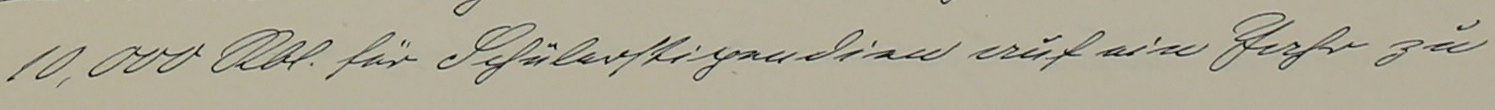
10.000 Rbl. für Schülerstipendien auf ein Jahr zu
